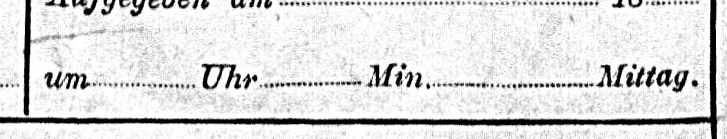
um .... Uhr .... Min......Mittag.
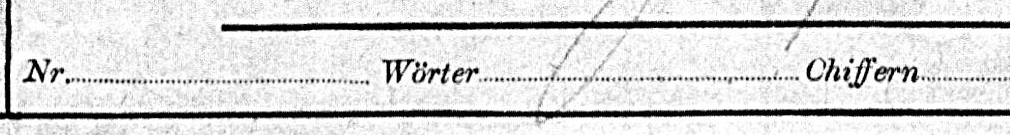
Nr.... Wörter .....Chiffern
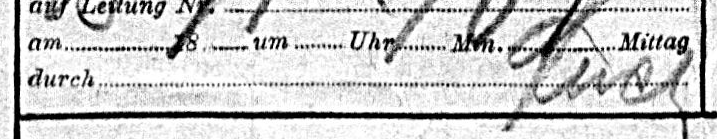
durch.....
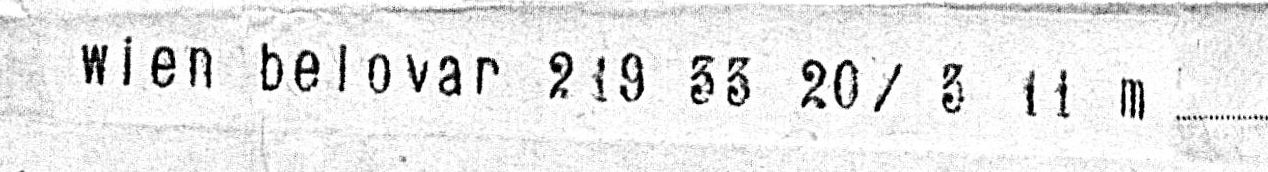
wien belovar 219 33 20/3 xxim
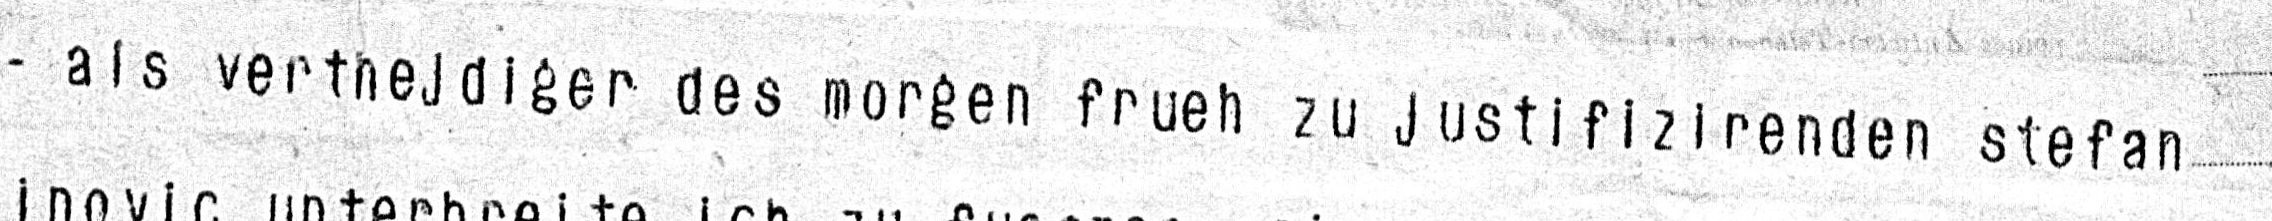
als verthejdiger des morgen frueh zu Justifizirenden stefan
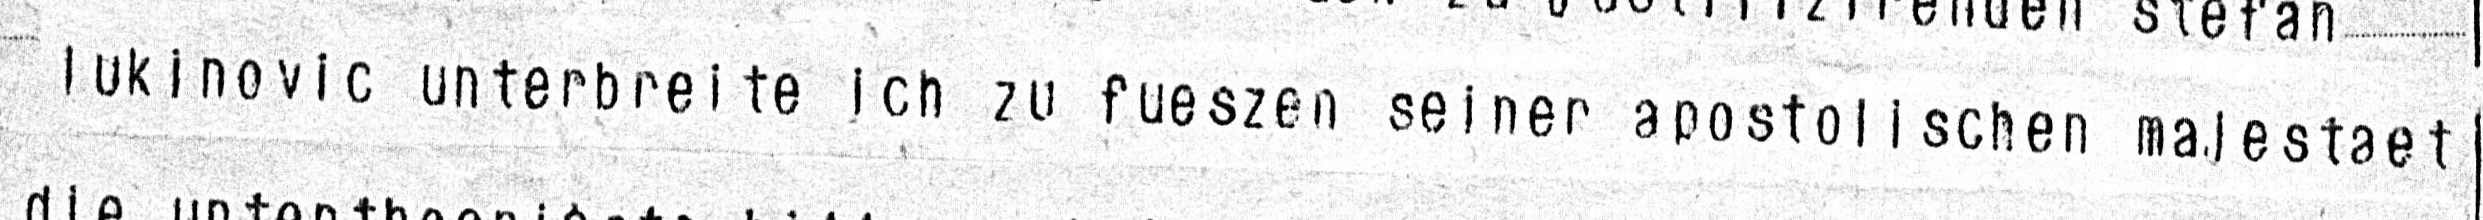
lukinovic unterbreite ich zu fueszen seiner apostolischen majestaet
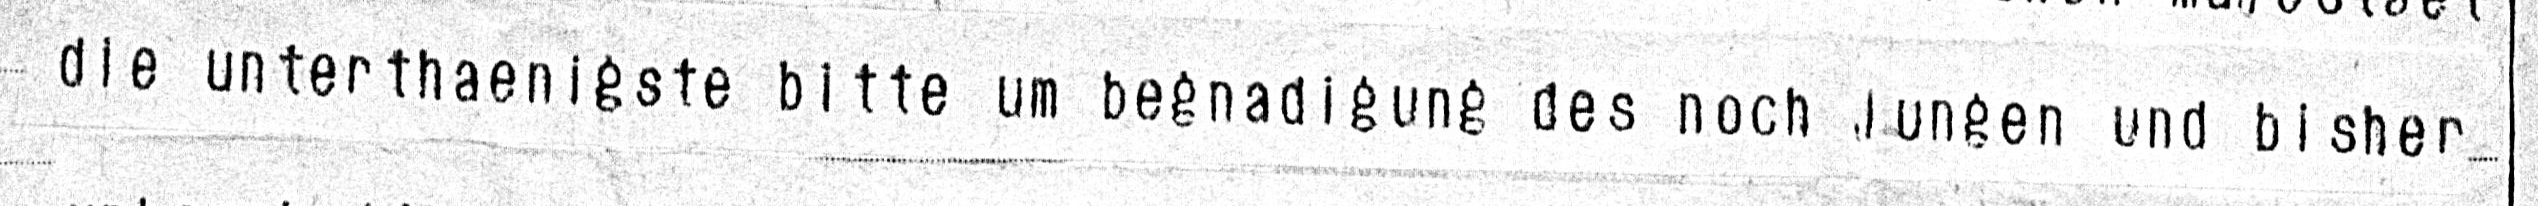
die unterthaenigste bitte um begnadigung des noch Jungen und bisher
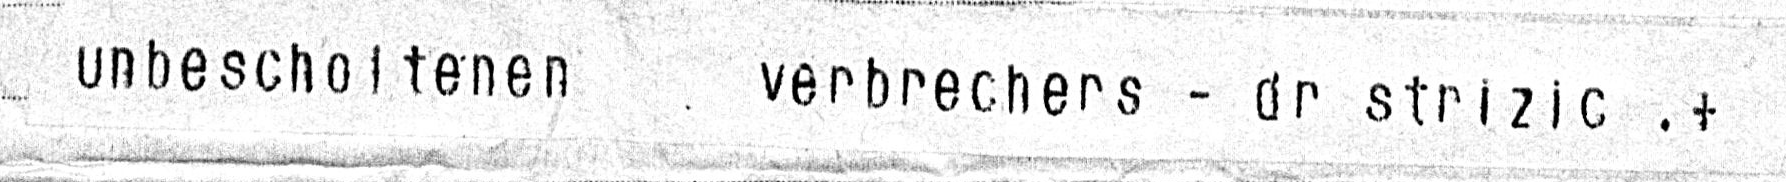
unbescholtenenverbrechers – drstrizic.+
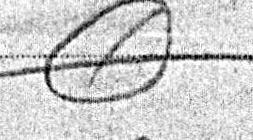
xx
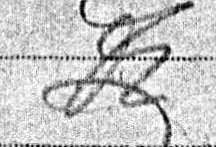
xx
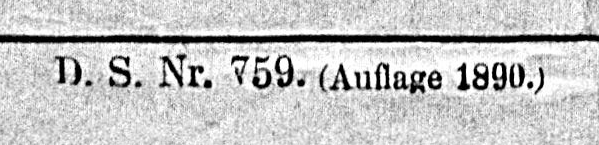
D. S. Nr. 759. (Auflage 1890.)
